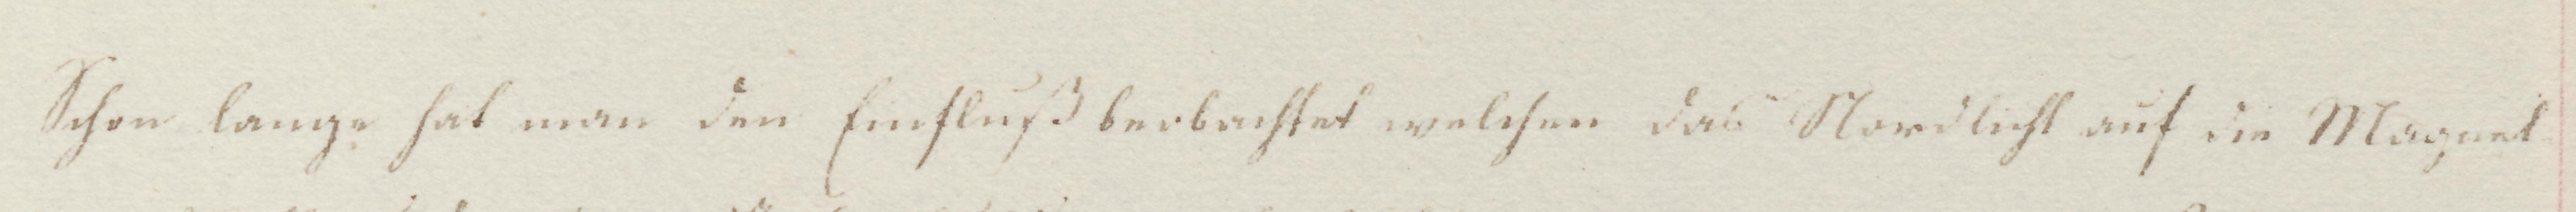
Schon lange hat man den Einfluß beobachtet welchen das Nordlicht auf die Magnet-
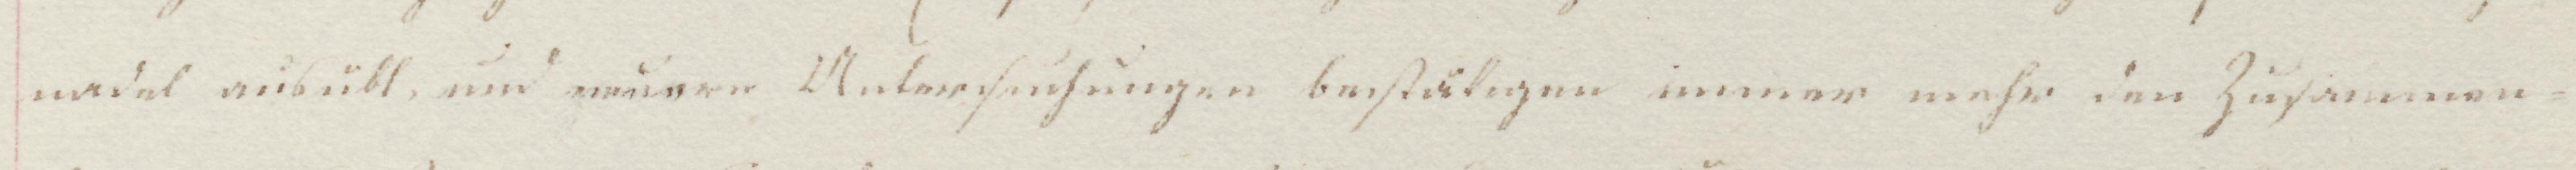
nadel ausübt, und neuere Untersuchungen bestätigen immer mehr den Zusammen-
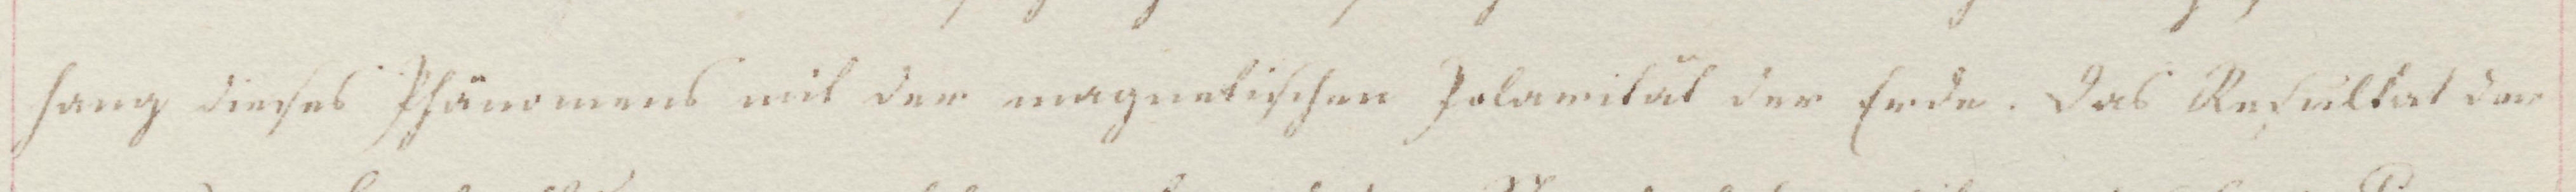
hang dieses Phänomens mit der magnetischen Polarität der Erde. Das Resultat der
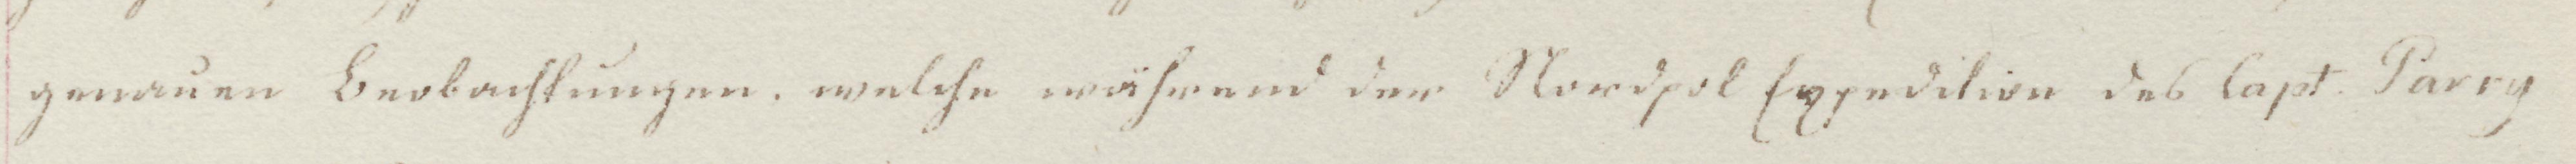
genauen Beobachtungen, welche während der Nordpol Expedition des Capt. Parry
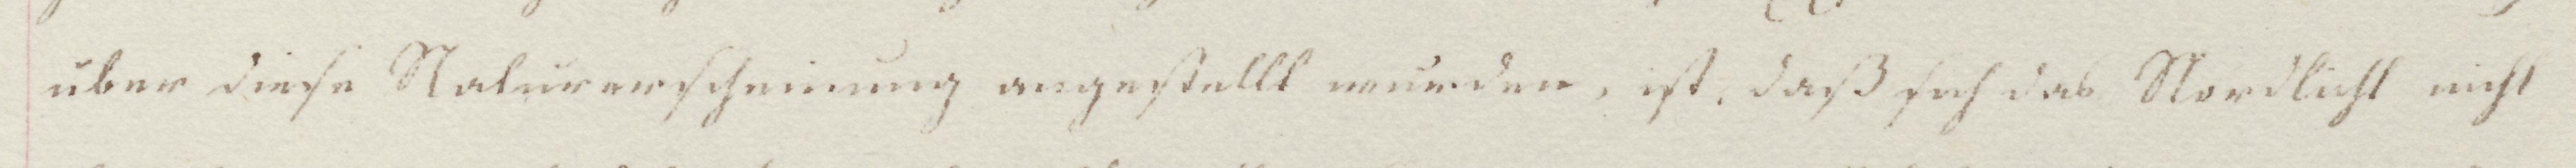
über diese Naturerscheinung angestellt wurden, ist, daß sich das Nordlicht nicht
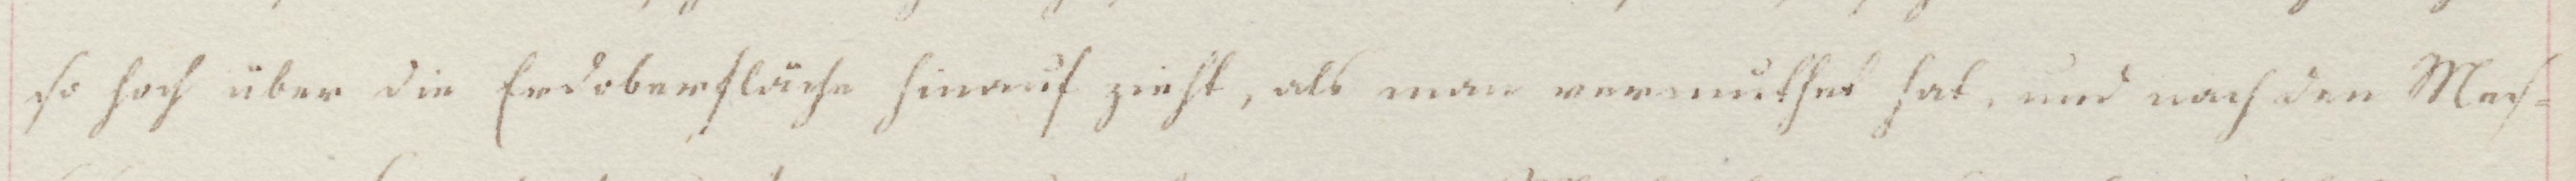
so hoch über die Erdoberfläche hinauf zieht, als man vermuthet hat, und nach den Mes-
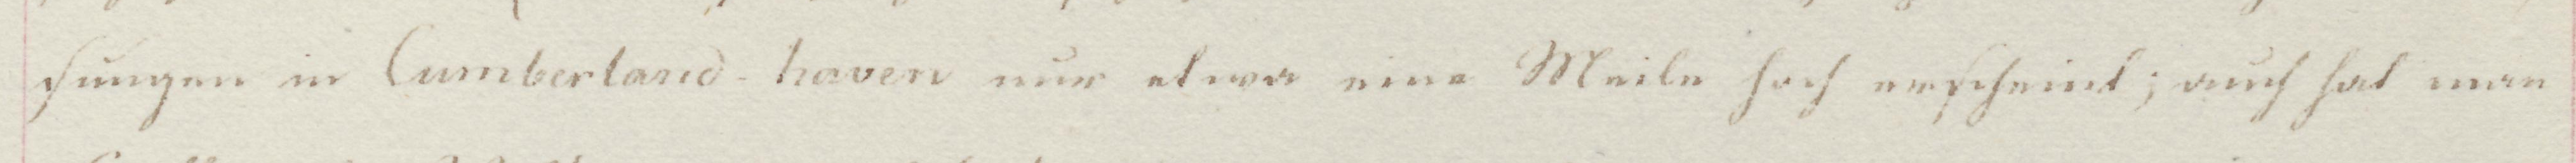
sungen in Cumberland-haven nur etwa eine Meile hoch erscheint; auch hat man
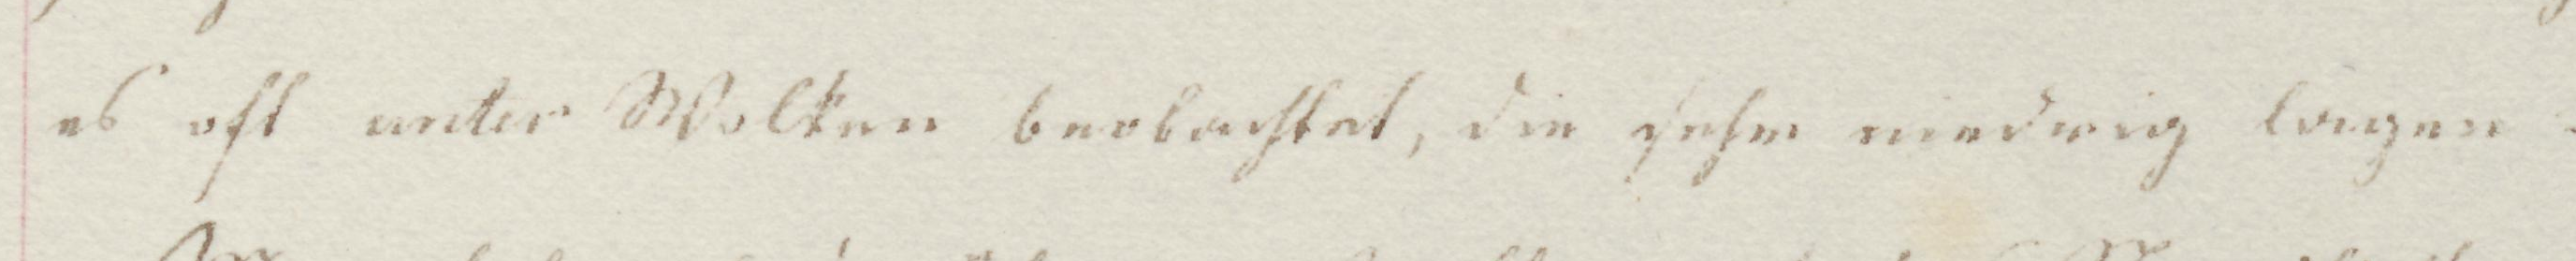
es oft unter Wolken beobachtet, die sehr niedrig lagen.
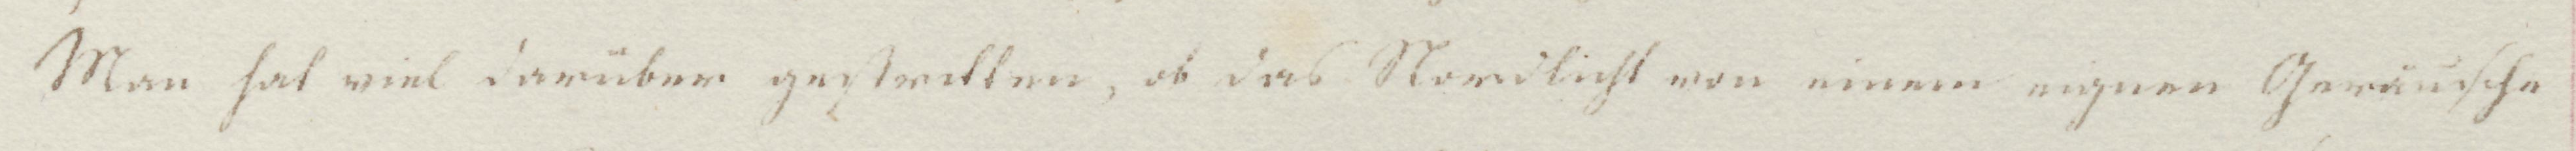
Man hat viel darüber gestritten, ob das Nordlicht von einem eignen Geräusche
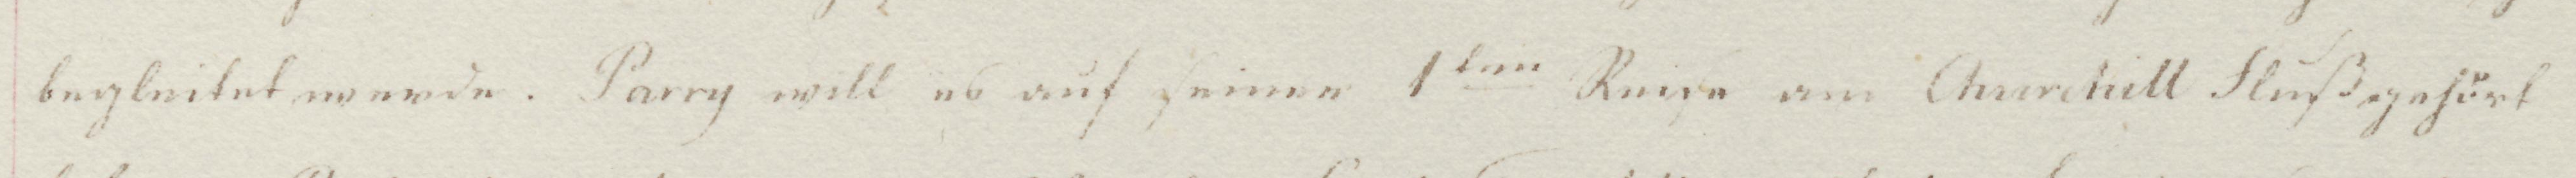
begleitet werde. Parry will es auf seiner 1ten Reise am Churchill Fluß gehört
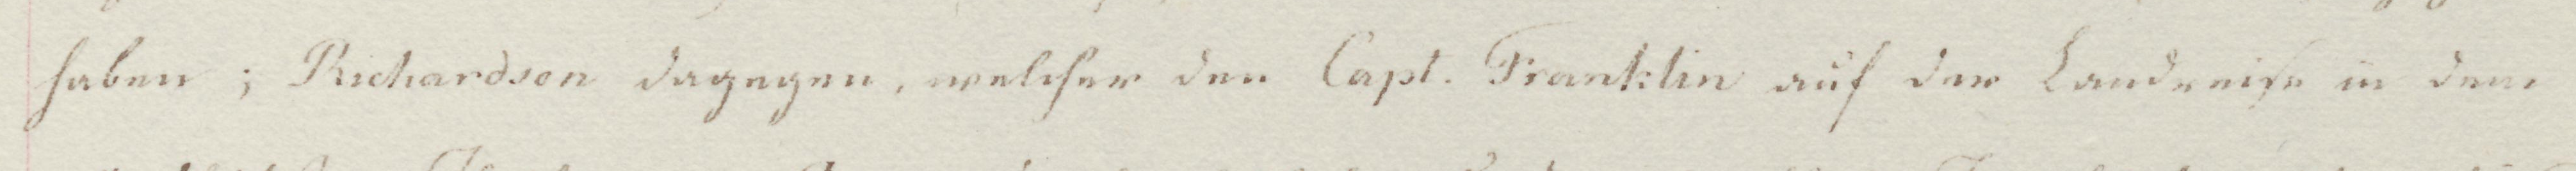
haben; Richardson dagegen, welcher den Capt. Franklin auf der Landreise in dem
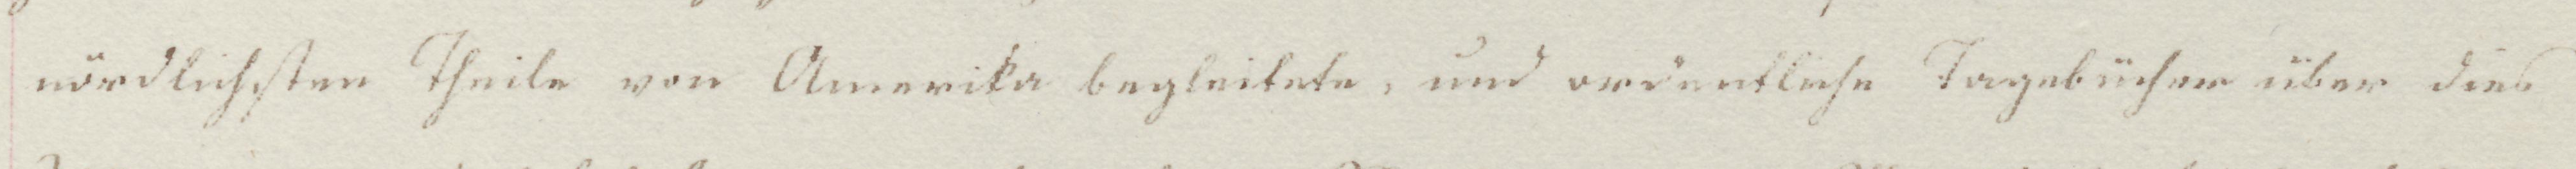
nördlichsten Theile von Amerika begleitete, und ordentliche Tagebücher über dies
